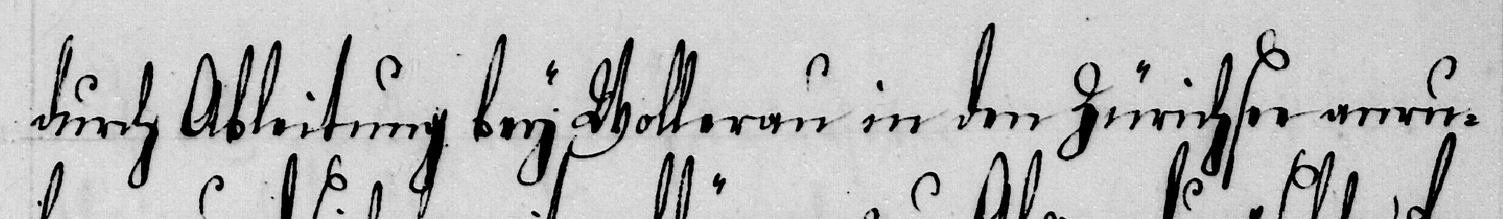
durch Ableitung bey Wollerau in den Zürichsee anru¬
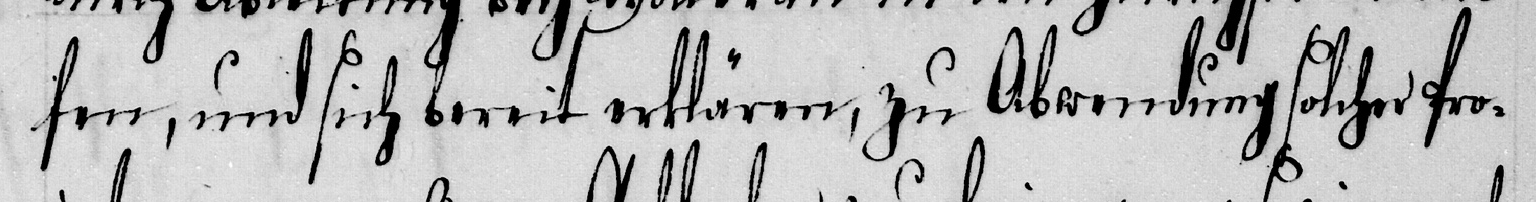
fen, und sich bereit erklären, zu Abwendung solcher Pr¬
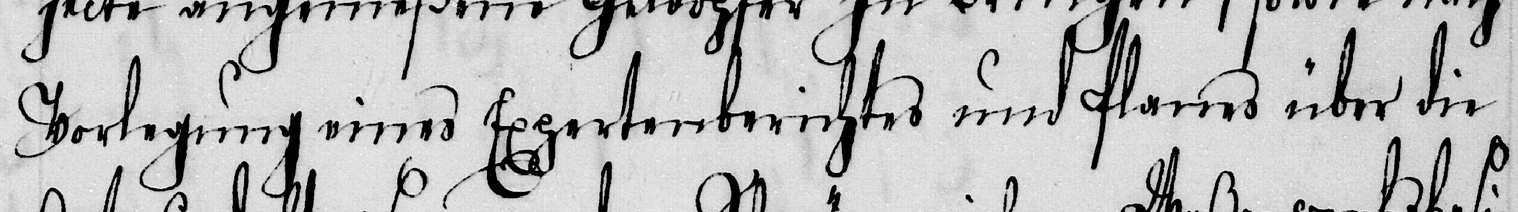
Vorlegung eines Expertenberichtes und Planes über die
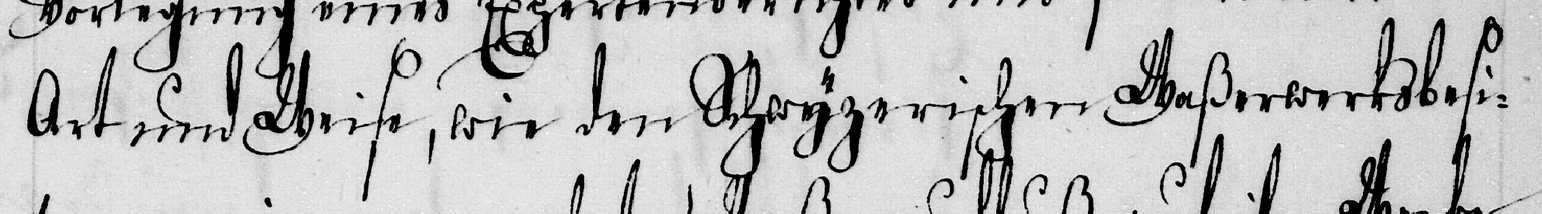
Art und Weise, wie den Schwyzerischen Waßerwerksbesi¬
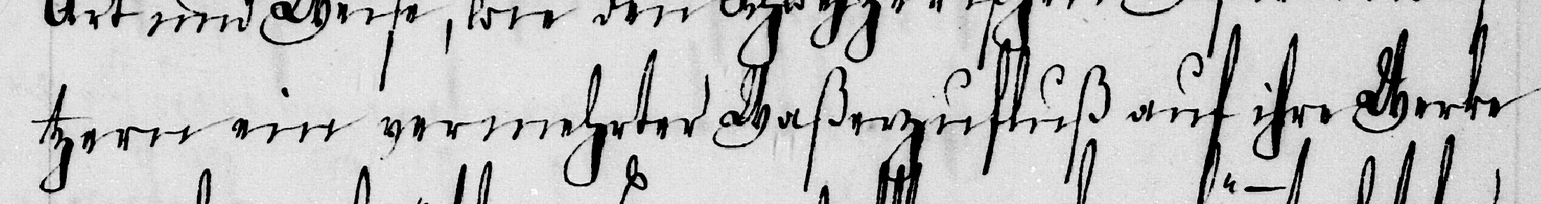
tzern ein vermehrter Waßerzufluß auf ihre Werke
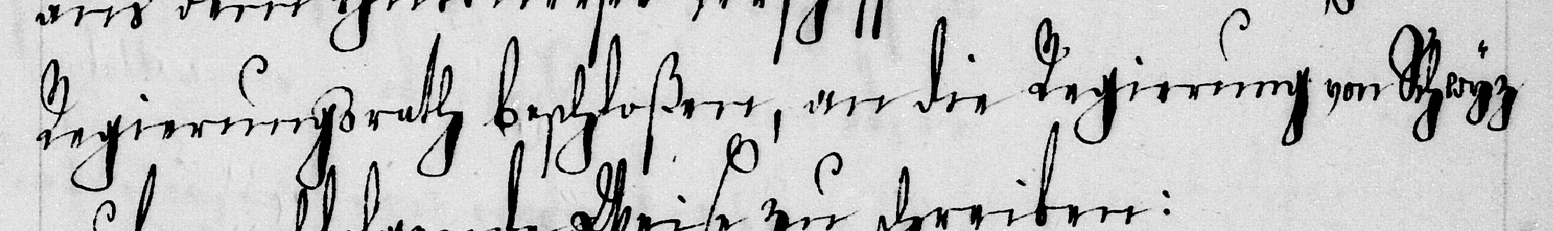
Regierungsrath beschloßen, an die Regierung von Schwyz
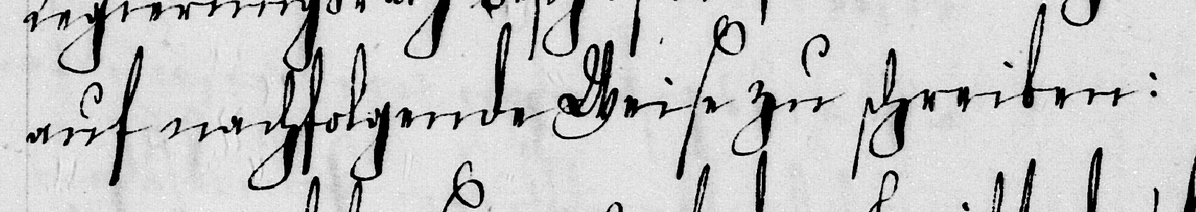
auf nachfolgende Weise zu schreiben:
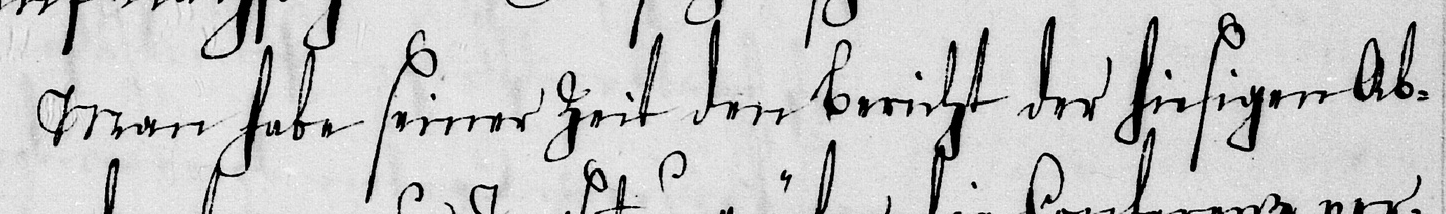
Man habe seiner Zeit den Bericht der hiesigen Ab¬
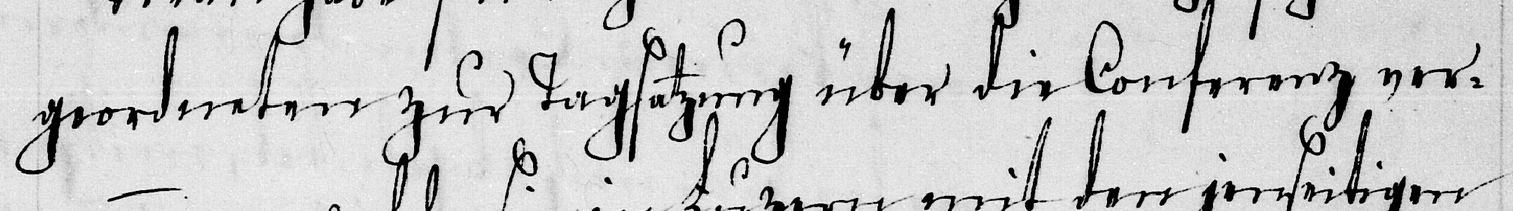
geordneten zur Tagsatzung über die Conferenz ver¬
